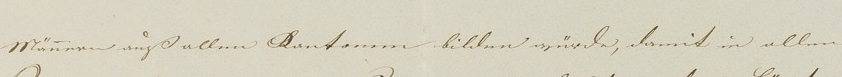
Männern auß allen Kantonen bilden würde, damit in allen
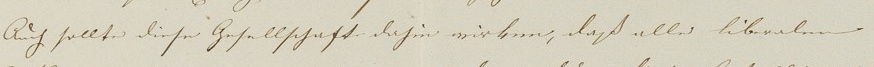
Auch sollte diese Gesellschaft dahin wirken, daß alle liberalen
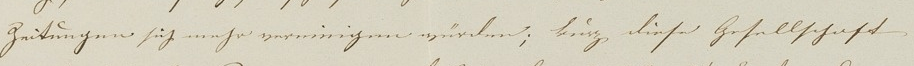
Zeitungen sich mehr vereinigen würden; kurz diese Gesellschaft
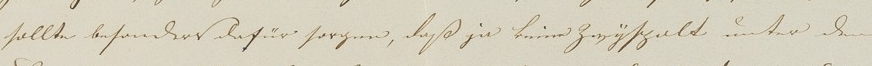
sollte besonders dafür sorgen, daß ja keine Zwyspalt unter den
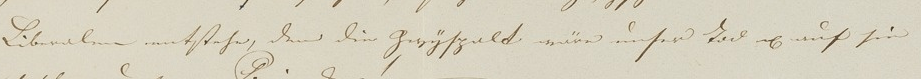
Liberalen entstehe, den die Zwyspalt wäre unser Tod & auf sie
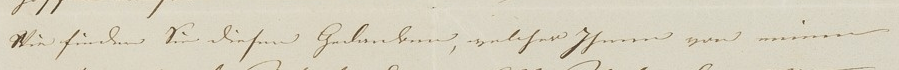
Wie finden Sie diesen Gedanken, welcher Ihnen von einem
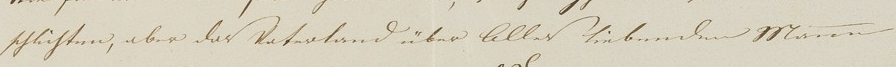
schlichten, aber das Vaterland über Alles liebenden Manne
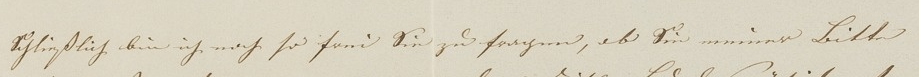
Schließlich bin ich noch so frei Sie zu fragen, ob Sie meiner Bitte
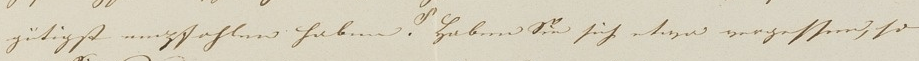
gütigst empfohlen haben? Haben Sie sich etwa vergessen, so
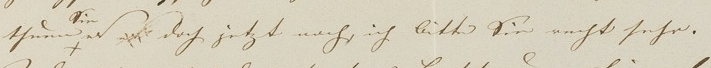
thuen Sie es ... doch jetzt noch, ich bitte Sie recht sehr.
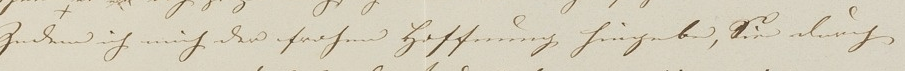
Indem ich mich der frohen Hoffnung hingebe, Sie durch
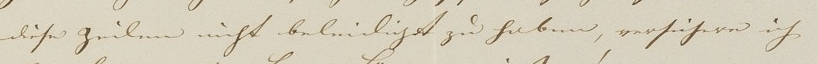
diese Zeilen nicht beleidigt zu haben, versichere ich
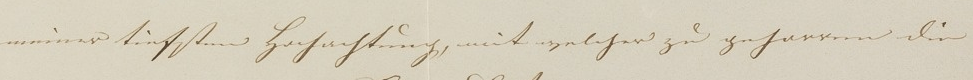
meiner tiefsten Hochachtung, mit welcher zu geharren die
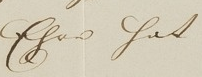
Ehre hat
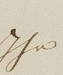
Ihr
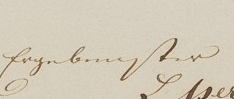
Ergebenster
